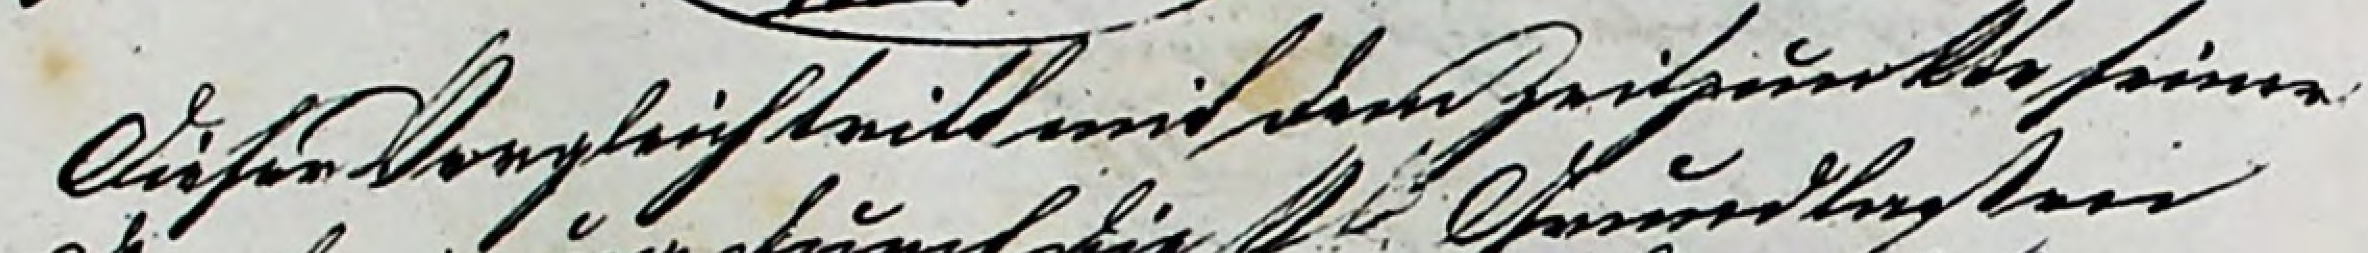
Dieser Vorgleichtritt mit dem Zeitzuckte seiner
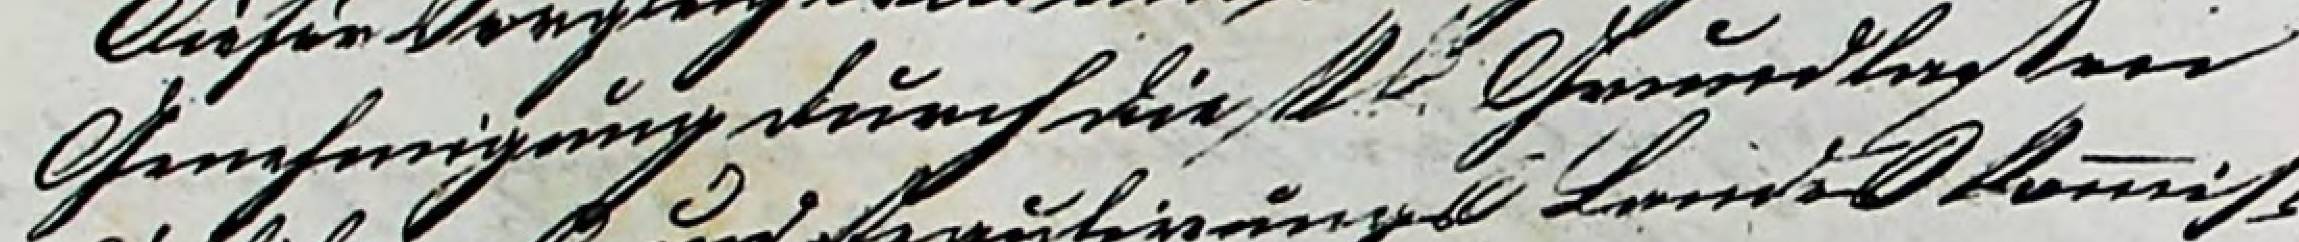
Genehmigung durch die k.k. Grundlasten
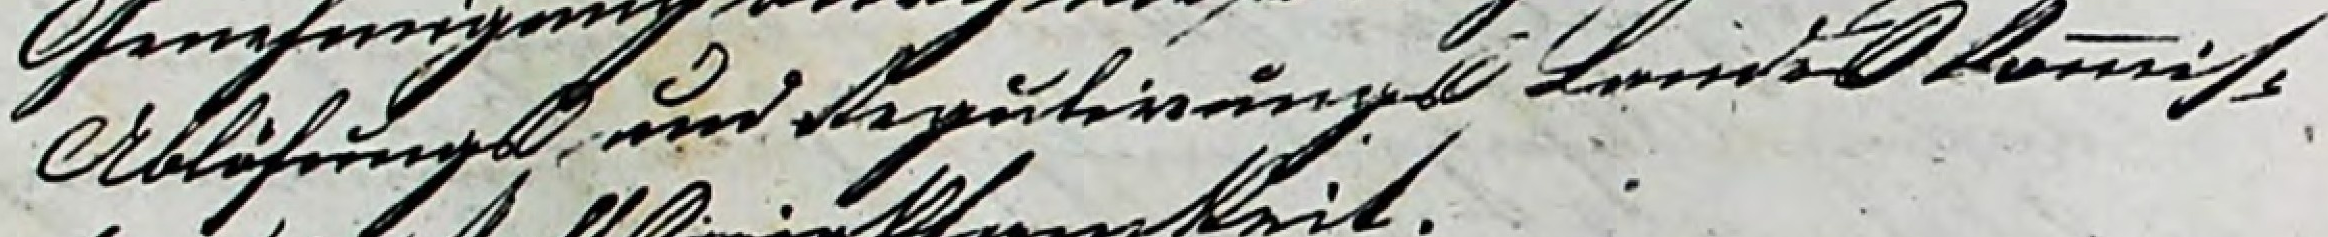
Ablösungs und Regulirungs Landes Kommis„
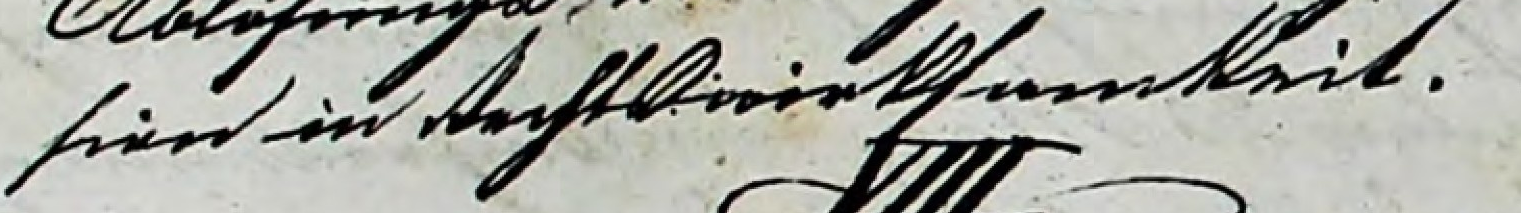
sion in Rechtswirksamkeit.
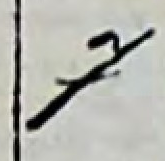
7
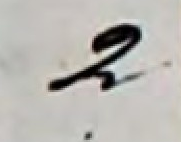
2
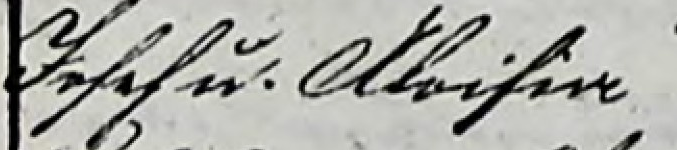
Josef u. Aloisia
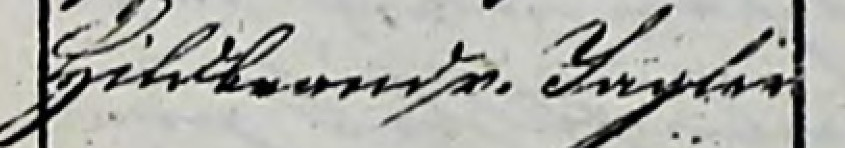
Hildbrand v. Jagler
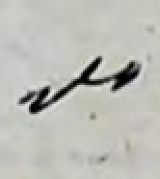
do
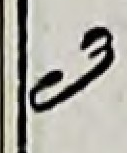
3
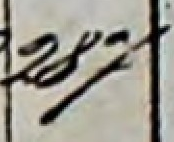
287
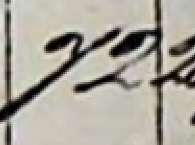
72
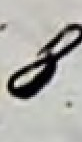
8
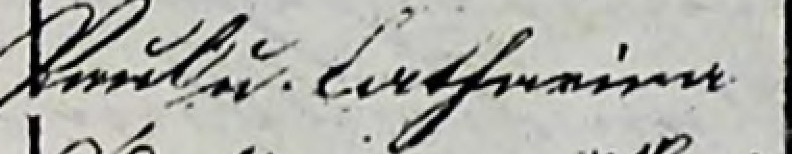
Paul u. Catharina
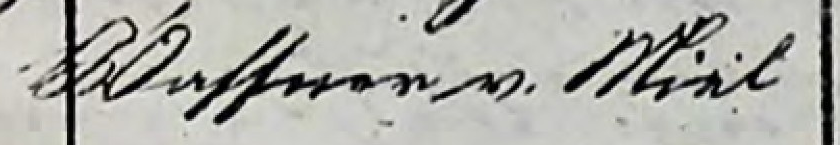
Wassner v. Miel
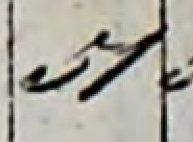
51
